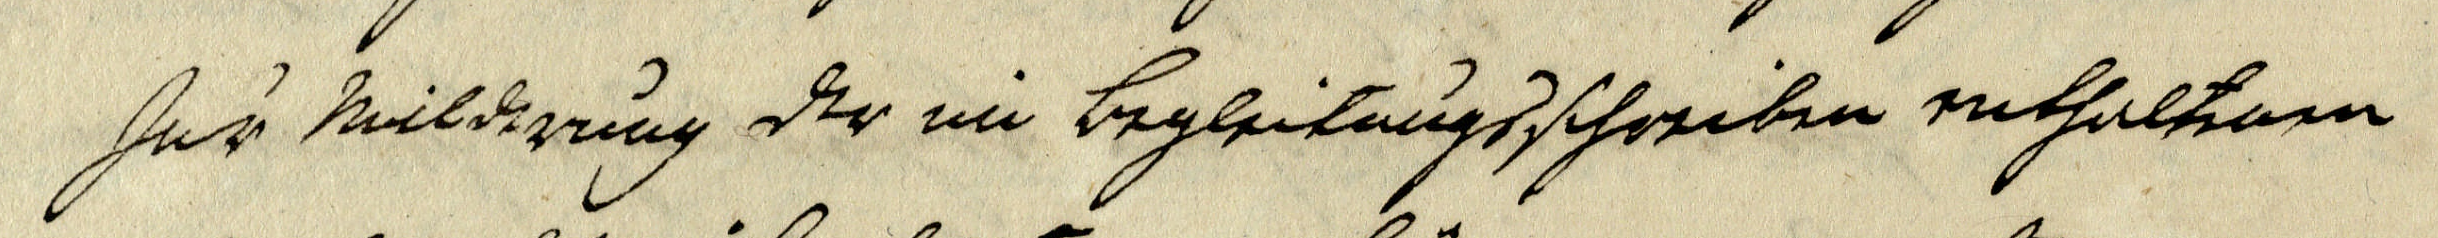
zur Milderung der im Begleitungsschreiben enthaltenen
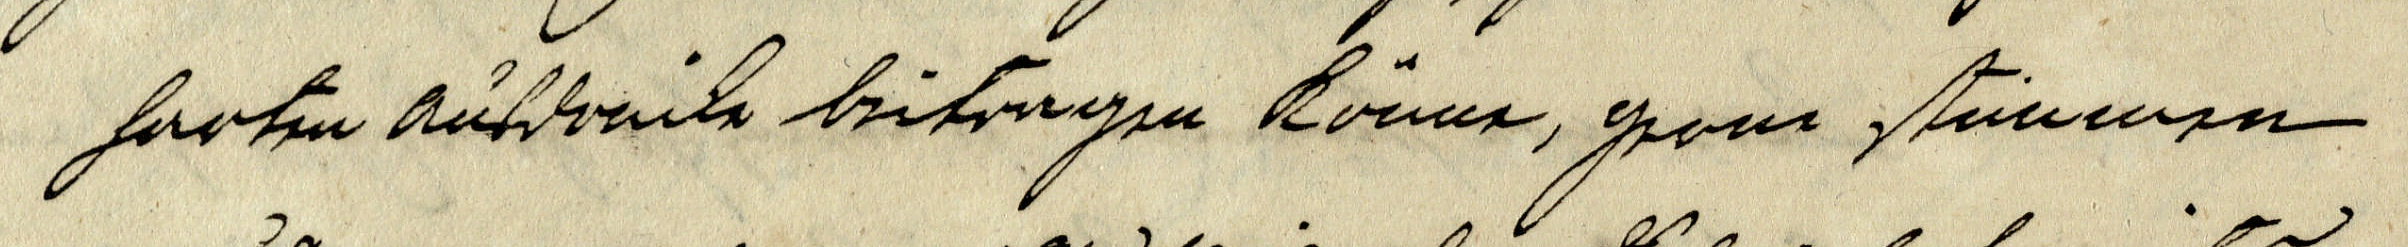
harten Ausdrücke beitragen könne, gerne stimmen
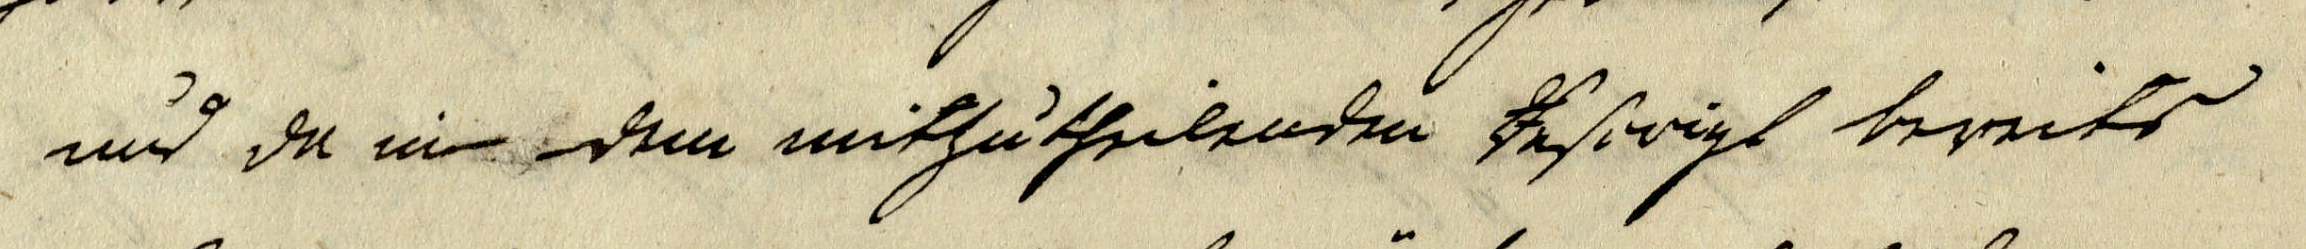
und da in dem mitzutheilenden Rescript bereits
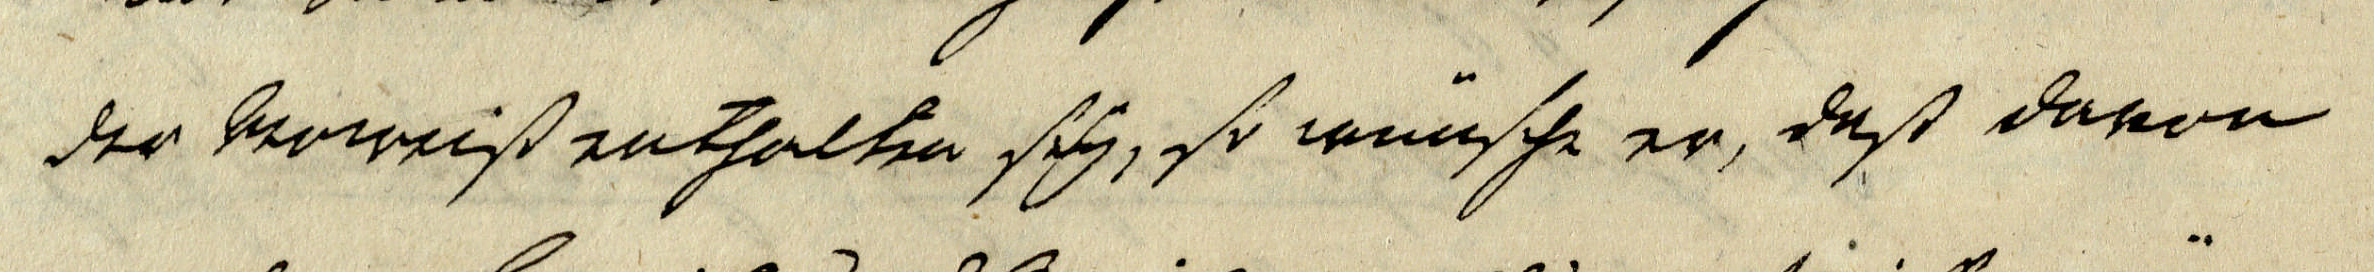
der Verweis enthalten seÿ, so wünsche er, daß davon
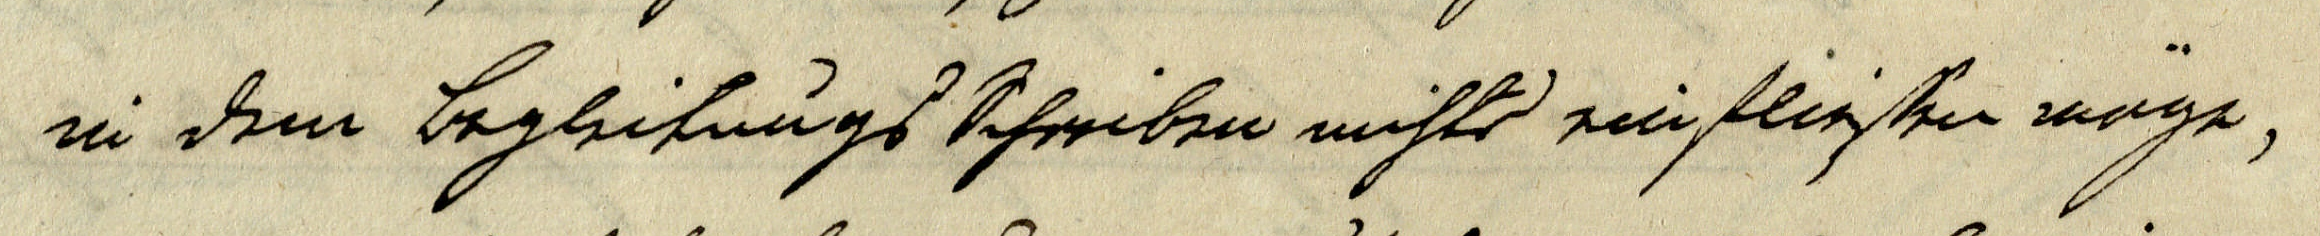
in dem Begleitungs Schreiben nichts einfliessen möge,
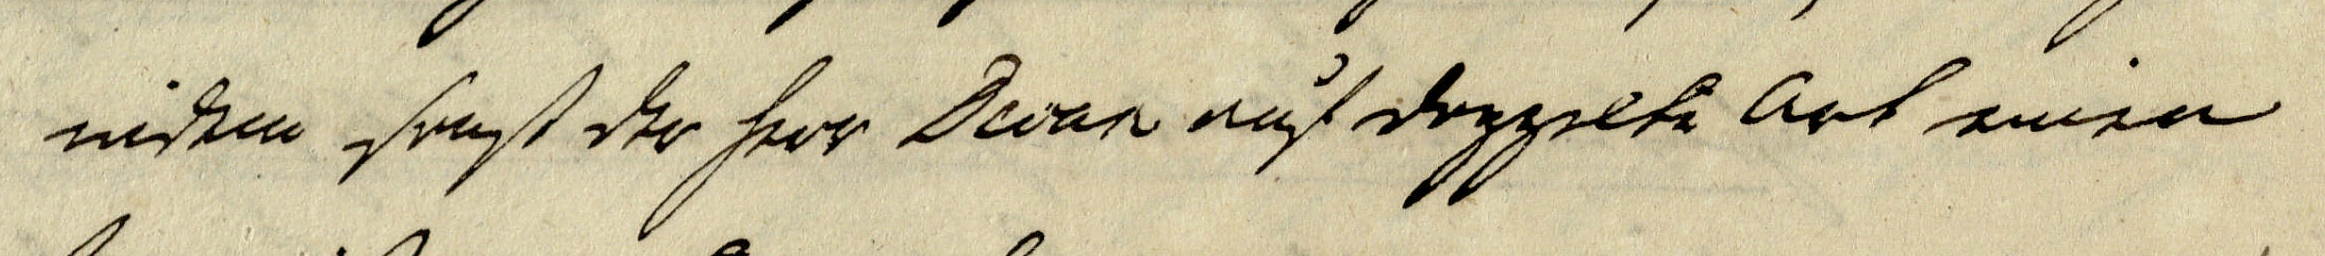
indem sonst der Herr Decan auf doppelte Art einen
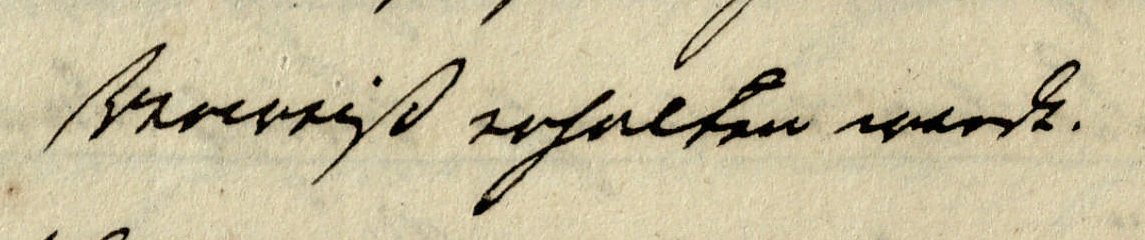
Verweis erhalten werde.
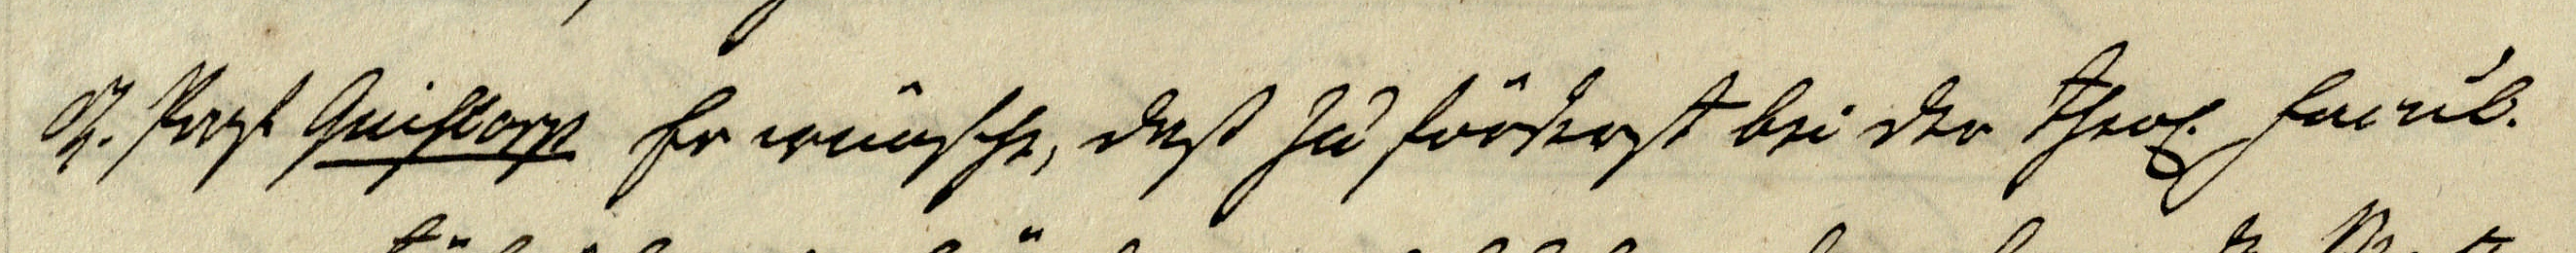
dh. Prof. Quistorp. Er wünsche, daß zu förderst bei der Theol. Facul¬
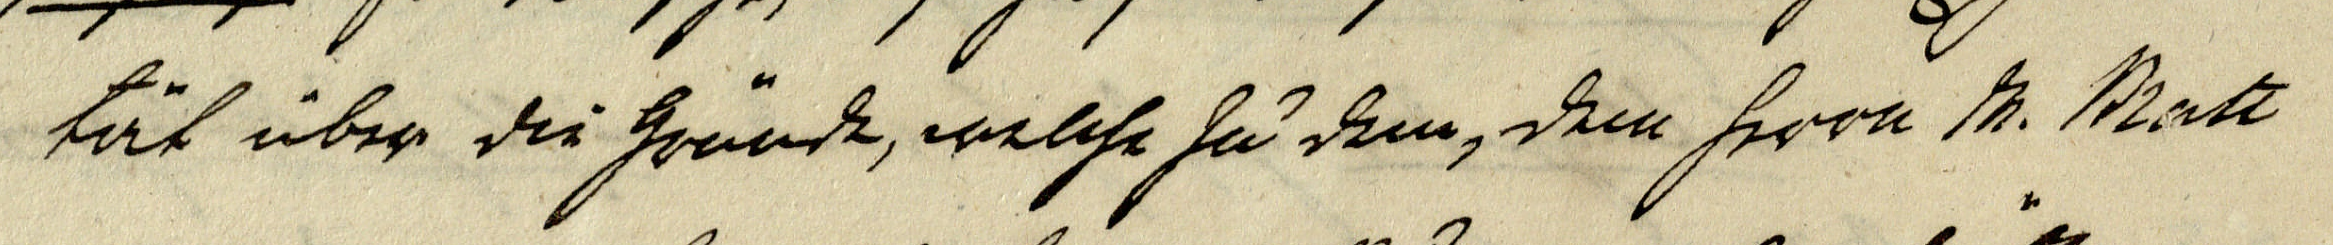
tät über die Gründe, welche zu dem, dem Herrn M. Bratt
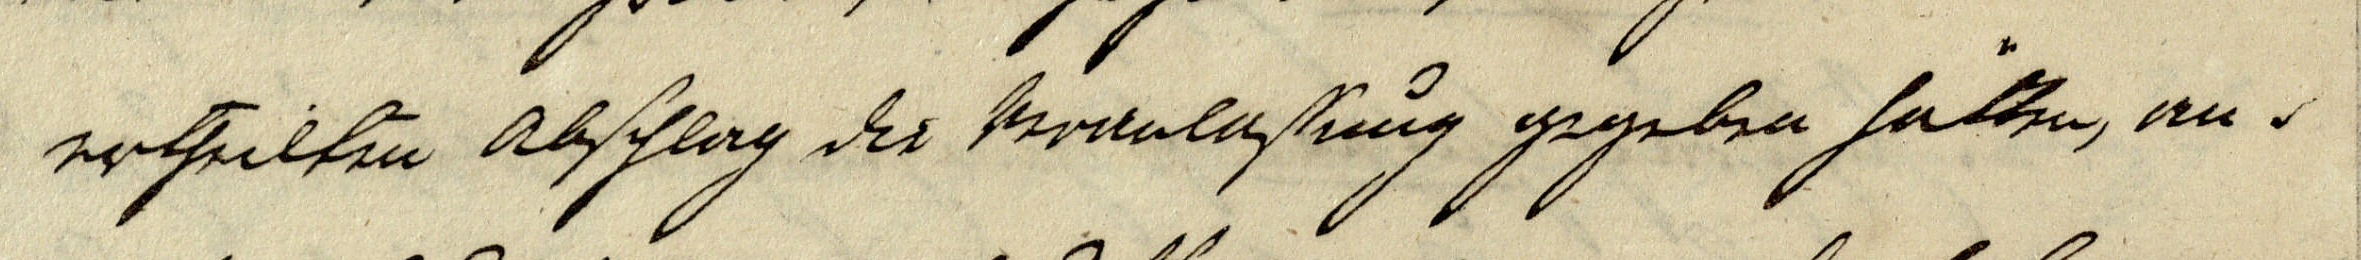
ertheilten Abschlag die Veranlassung gegeben hätten, an¬
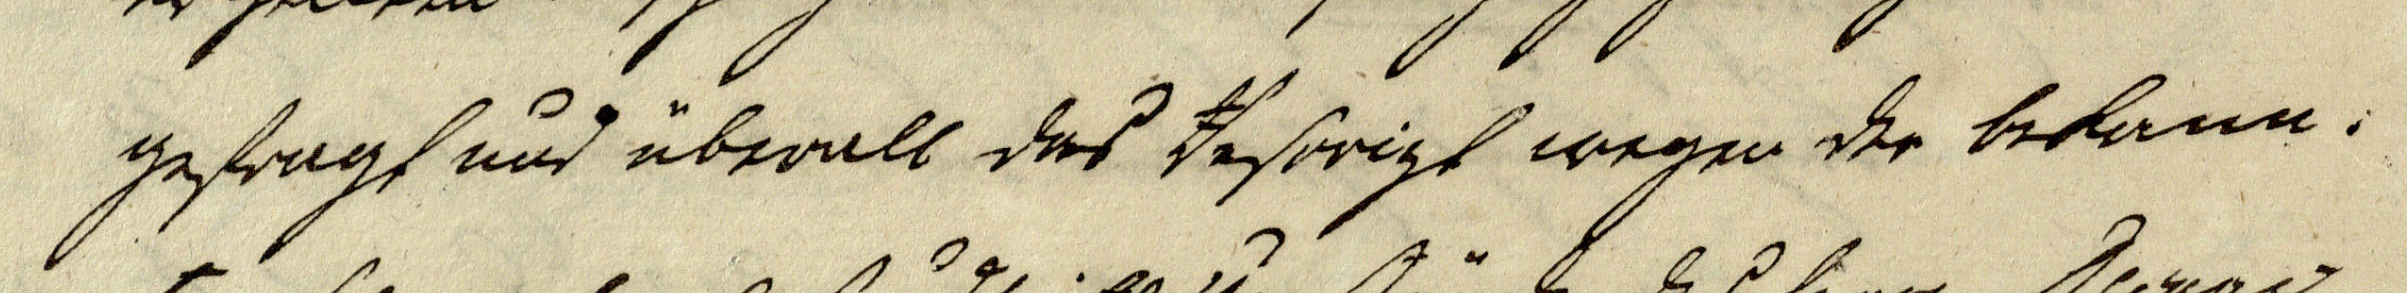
gefragt und überall das Rescript wegen der bekann¬
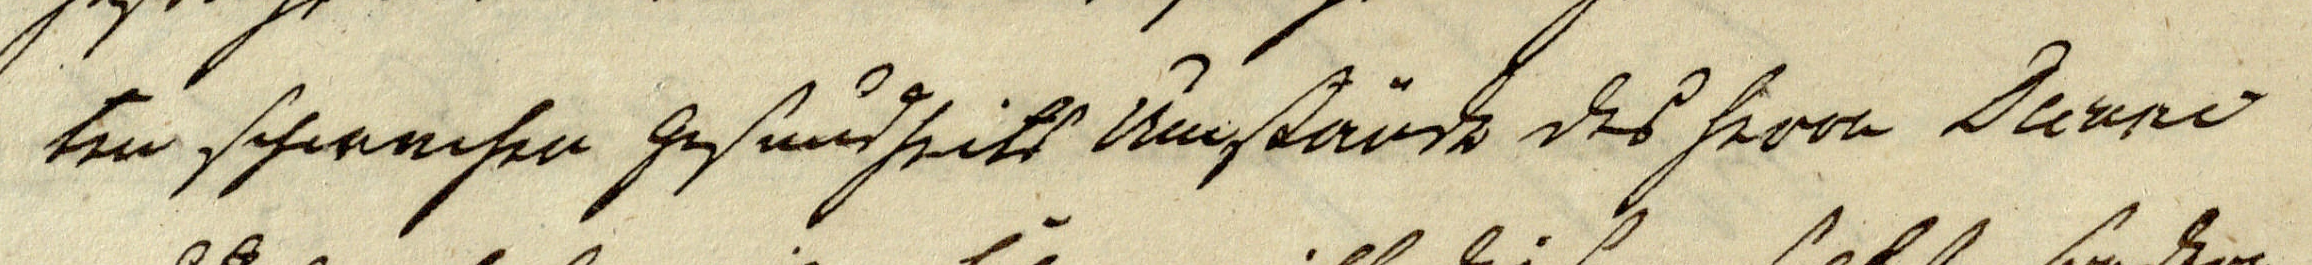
ten schwachen Gesundheits Umstände des Herrn Decani
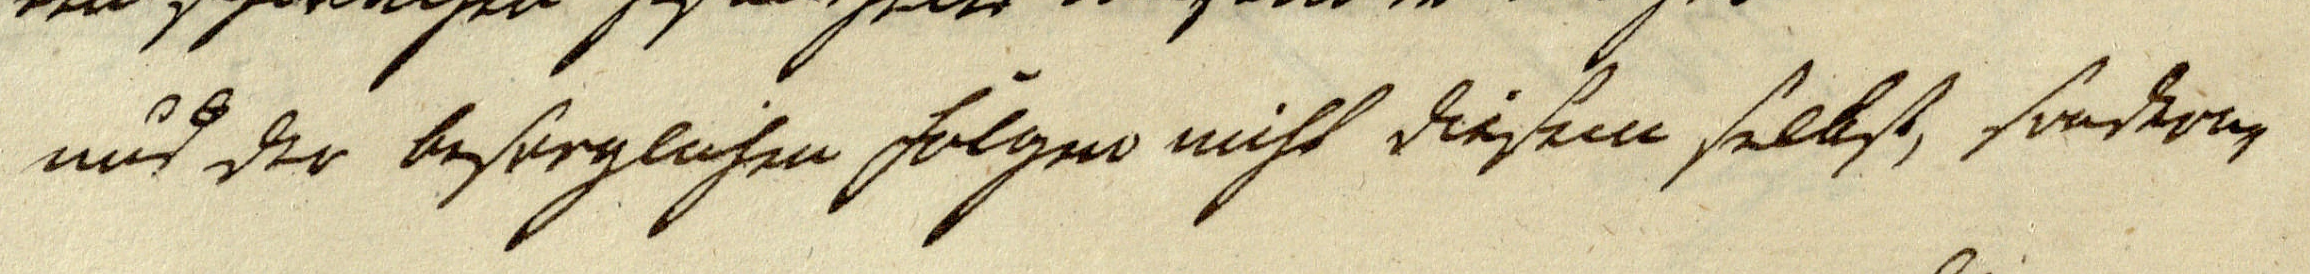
und der besorglichen Folgen nicht diesem selbst, sondern,
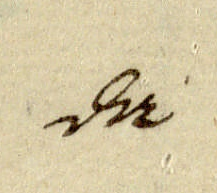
da
